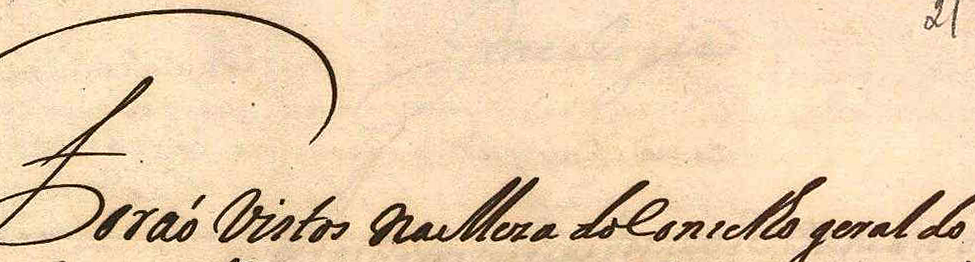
Foraõ vistos na Meza do Conselho geral do
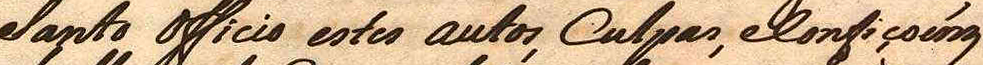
Santo officio estes autos, Culpas, e Confiçoẽnz
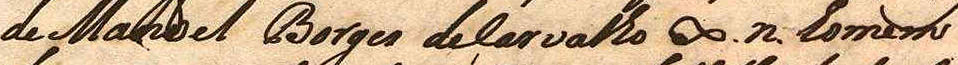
de Manoel Borges de Carvalho x. n. homem
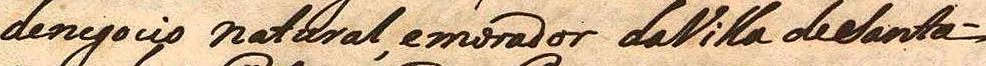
de negocio natural, e morador da Villa de Santa
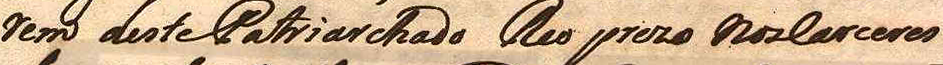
rem deste Patriarchado Reo prezo noz Carceres
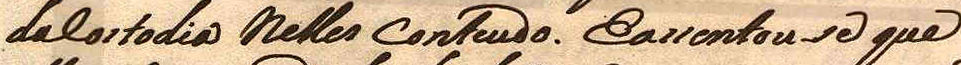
da Costodia Nelles Conteudo. E assentou-se que
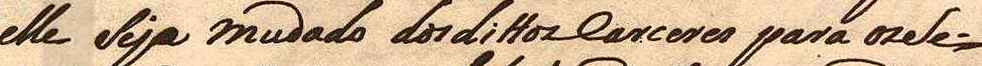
elle Seja mudado dos ditos Carceres para oz se
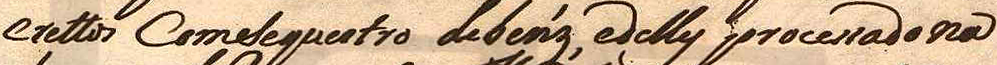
crettos Com Sequestro de benz, e delles processado na
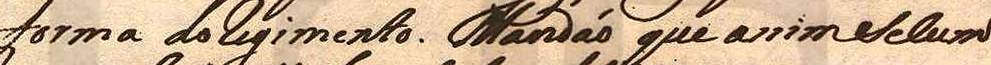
forma do Regimento. Mandaõ que assim Se Cum
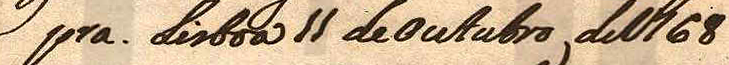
pra. Lisboa 11 de outubro de 1768
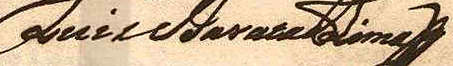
Luis Barata de Lima
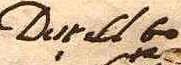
Deste Cl 60
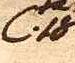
C.ta 18
